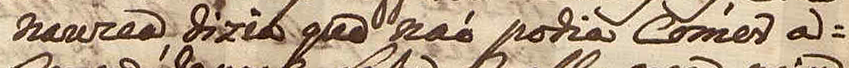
nauzea dizia que naõ podia Comer a
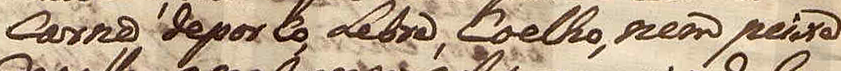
Carne de porco, Lebre, Coelho, nem peixe
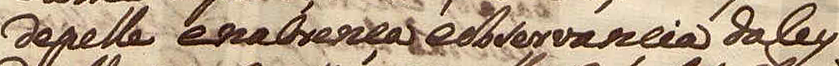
de pelle e na crença e observancia da ley
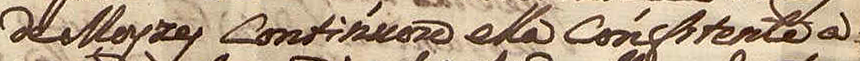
de Moyzes continuou ella confitente a
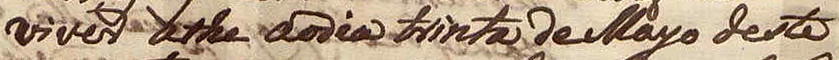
viver athe ao dia trinta de Mayo deste
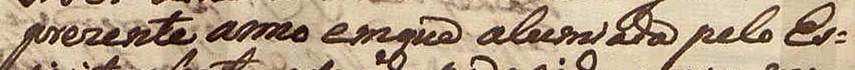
prezente anno em que alumiada pelo Es
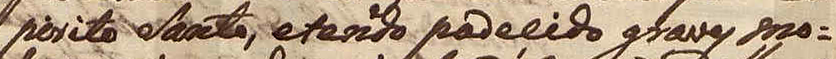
perito Santo, e tendo padecido graves mo
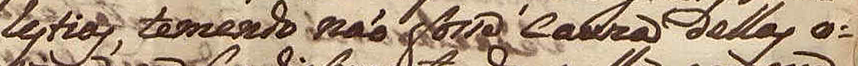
lestias, temendo naõ fosse cauza dellas o
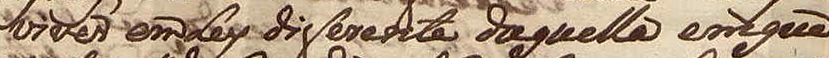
viver em Ley diferente daquella em que
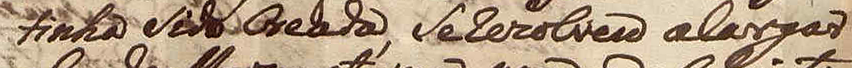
tinha sido Creada, se Rezolveu a largar
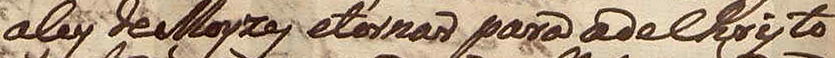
a ley de Moyzes e tornar para a de Christo
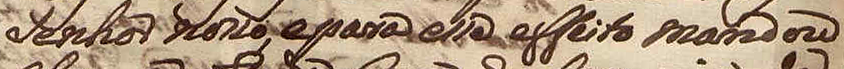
senhor nosso, e para esse effeito mandou
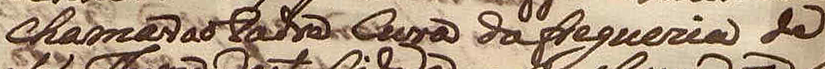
chamar ao Padre Cura da freguezia de
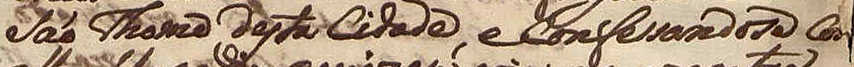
Saõ Thome desta Cidade, e Confessandose com
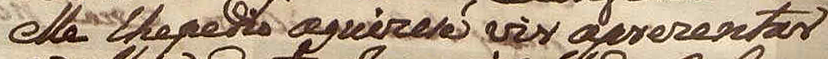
elle lhe pedio a quizese vir aprezentar
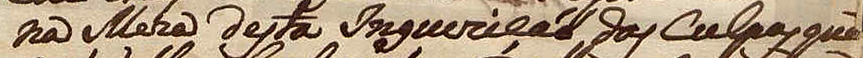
na Meza desta Inquiziçaõ das Culpas que
